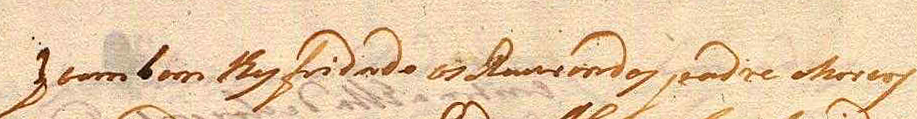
q̄ tambem lhes foi dado os Reuerendos padre Marcos
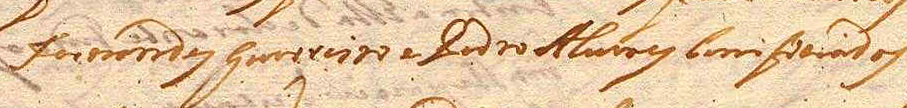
Fernandes Guerreiro, e Pedro Alueres benificiados
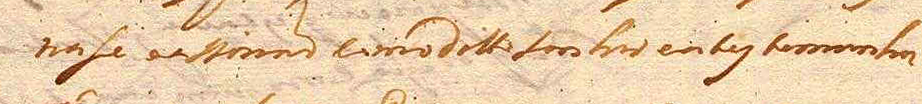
na se e assinaraõ com o ditto senhor e a testemunha
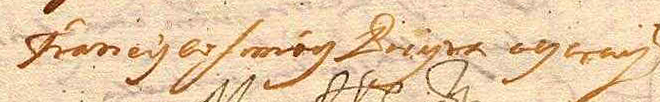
Francisco Simões Pereyra o escreuj
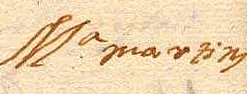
Ma martins
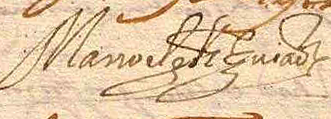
Manoel gl̄z Guiaō
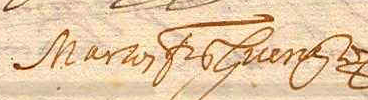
Marcos Frs̄ Queros̄
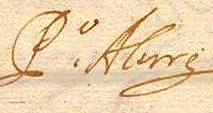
P.o Alures
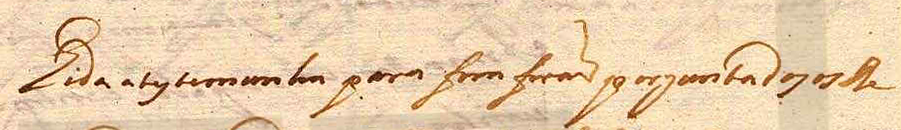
E ida a testemunha para fora foraõ perguntados os Re
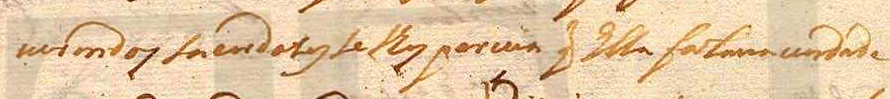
uerendos sacerdotes se lhes poruia q̄ Ella falaua uerdade
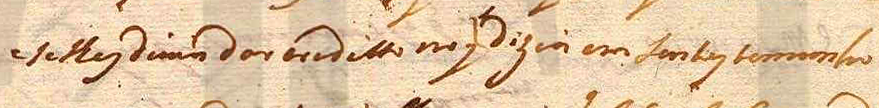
e se lhes diuia dar creditto no q̄ dizia em seu testemunho
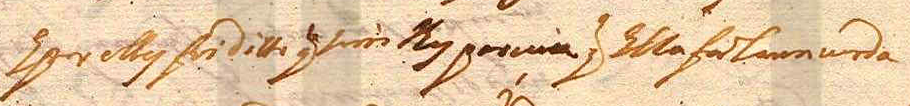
E por elles foi ditto q̄ sim lhes parecia q̄ Ella falaua uerda
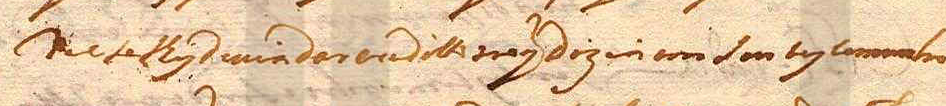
de e se lhes deuia dar creditto no q̄ dizia em seu testemunho
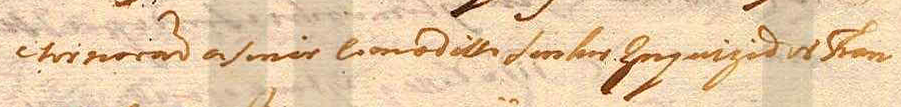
e tornaraõ asinar com o ditto Senhor Jnquizidor Fran
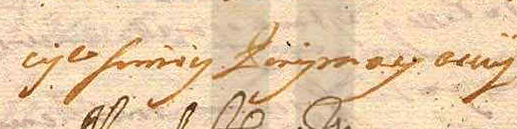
cisco simois Pereyra o escreuj
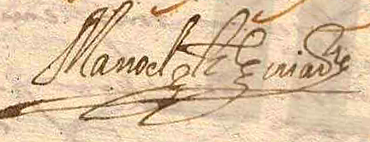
Manoel glz̄ Guiaõ
